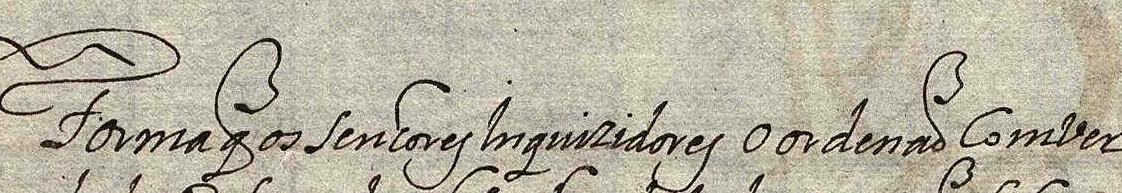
Forma q̄ os senhores Inquizidores o ordenaõ com ver
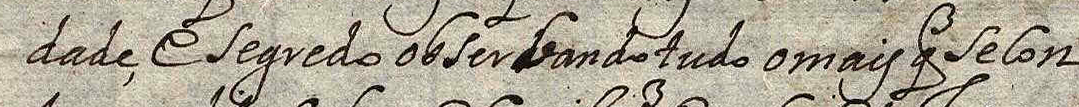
dade, e segredo observando tudo o mais q̄ se con
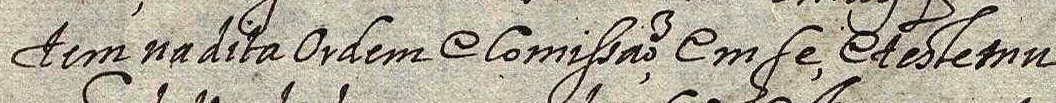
tem na dita Ordem e Comissaõ, em fe, e testemu
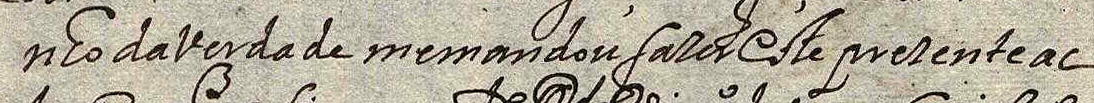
nho da verdade me mandou fazer este prezente ac
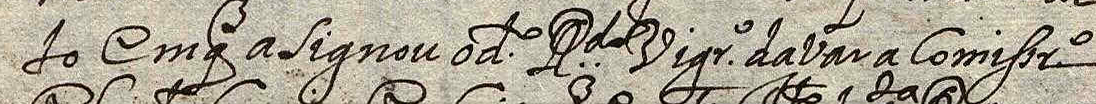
to em q̄ asignou o d̄.o R.d Vigr.o da vara Comissr.o
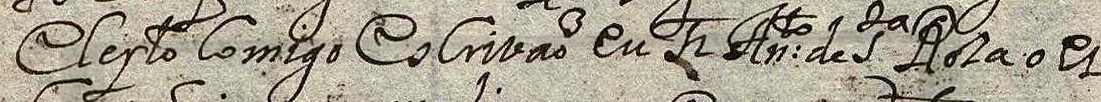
Eleyto Comigo EsCrivaõ Eu Fr An.to de Sta Roza o es
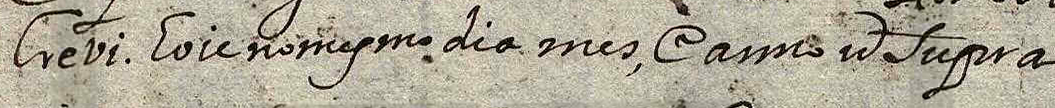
Crevi: hoie no mesmo dia mes, e anno ut̄ supra
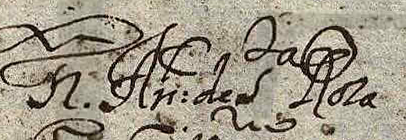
Fr. An.o de S.ta Roza
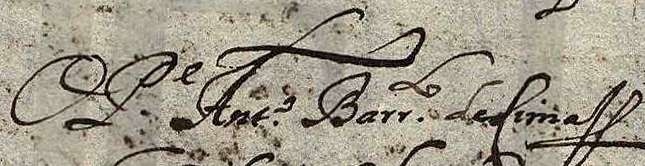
O P.e Ant.o Barr.to de Lima
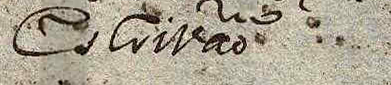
EsCrivaõ
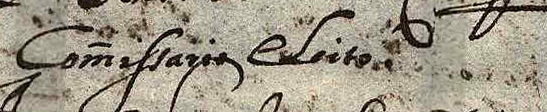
Com̄issario eLeito
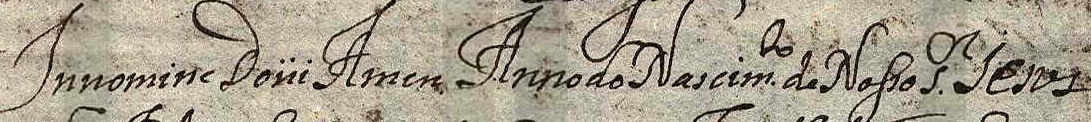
Innomine Doni Amen Anno do Nascim.to de Nosso S.or IEsvs
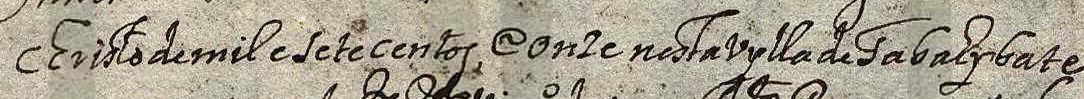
christo de mil e setecentos, e onze nesta vylla de Tabahybate
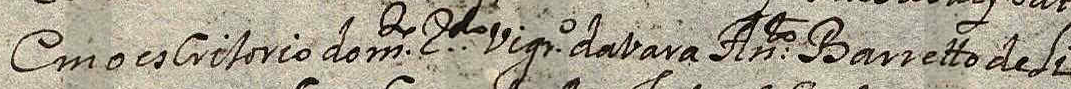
Em o esCritorio do m.to R.do Vigr.o da vara An.to Barretto de Li
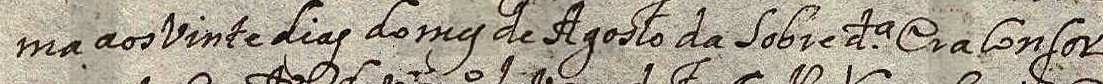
ma aos vinte dias do mes de Agosto da Sobred̄.a Era confor
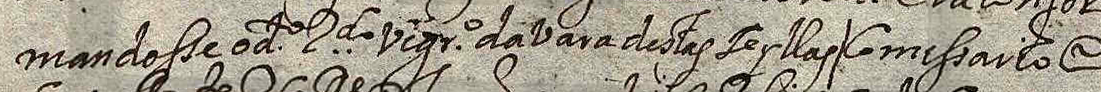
mandosse o d̄.o L.do Vigr.o da Vara destas Vyllas/ Comissario E
